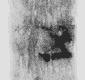五
